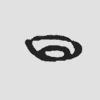日
